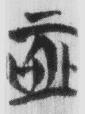亟
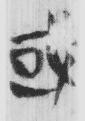或
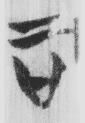司
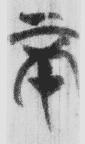不
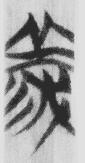義
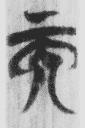而
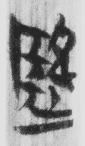{降止}
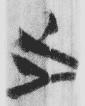之
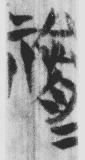示骨=
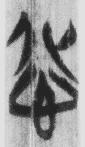{化心}
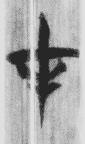才
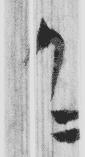人=
